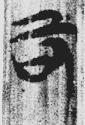可（何）
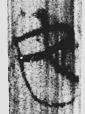女（如）
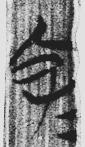孔子
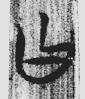曰
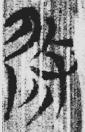攸（修）
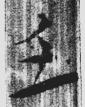身
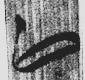㠯（以）
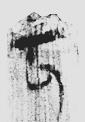先
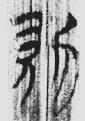則
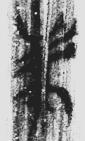民
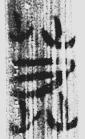莫
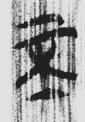不
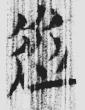從
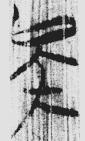矣
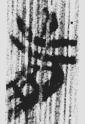歬（前）
